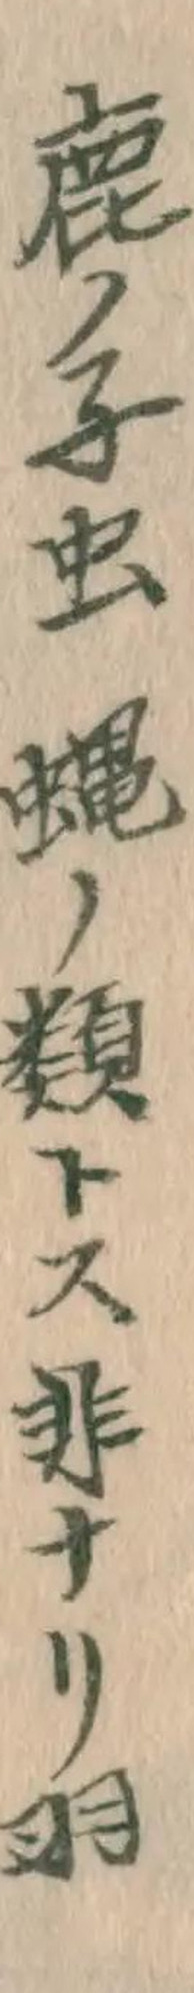鹿ノ子虫蝿ノ類トス非ナリ羽
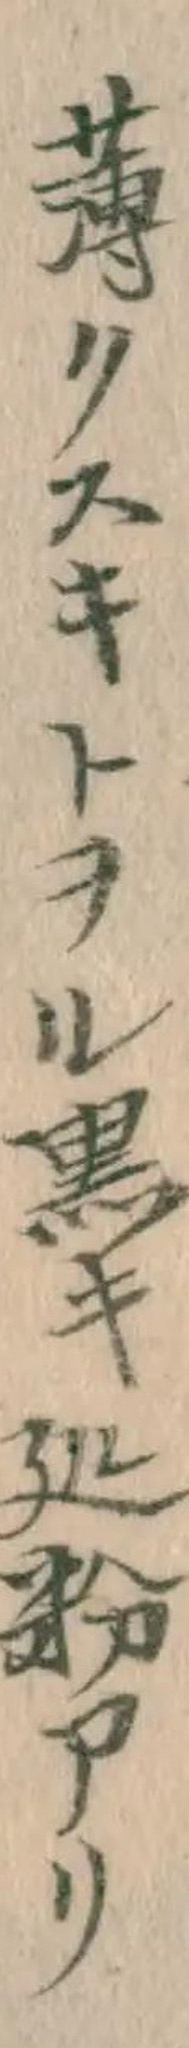薄クスキトヲル黒キ処粉アリ
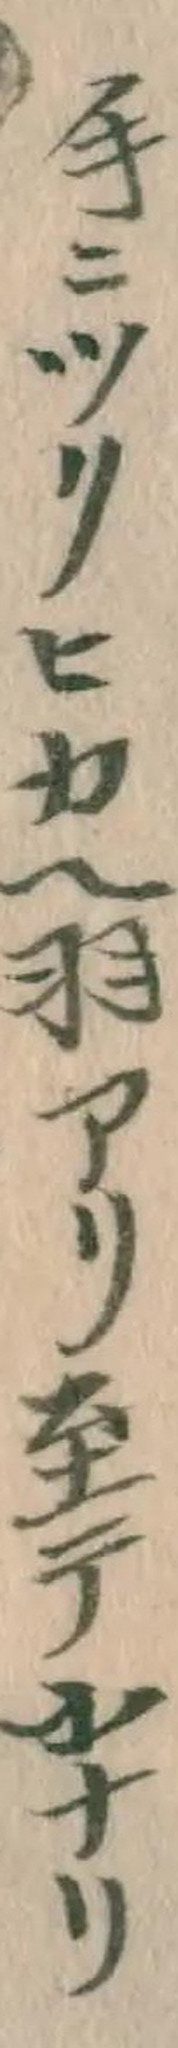手ニツクヒカヘ羽アリ至テ小ナリ
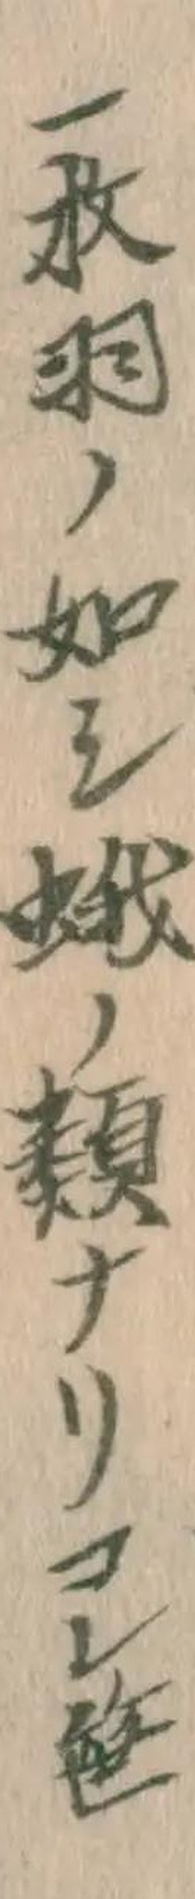一枚羽ノ如シ蛾ノ類ナリコレ笹
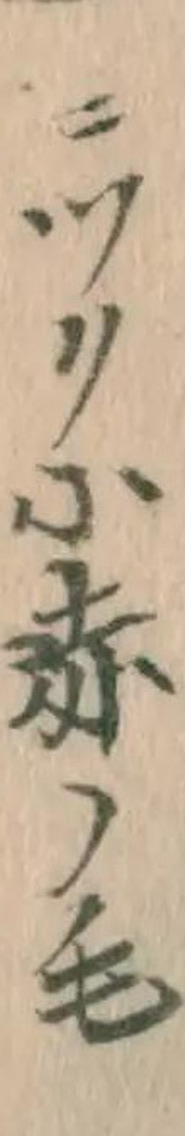ニツク小赤ノ毛
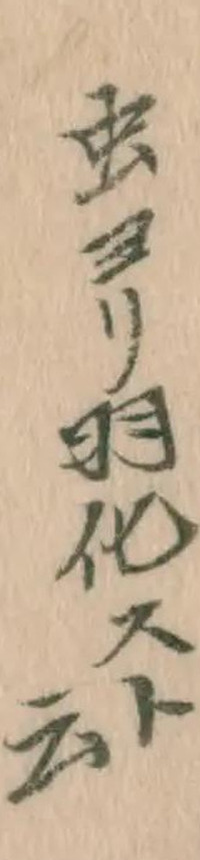虫ヨリ羽化スト

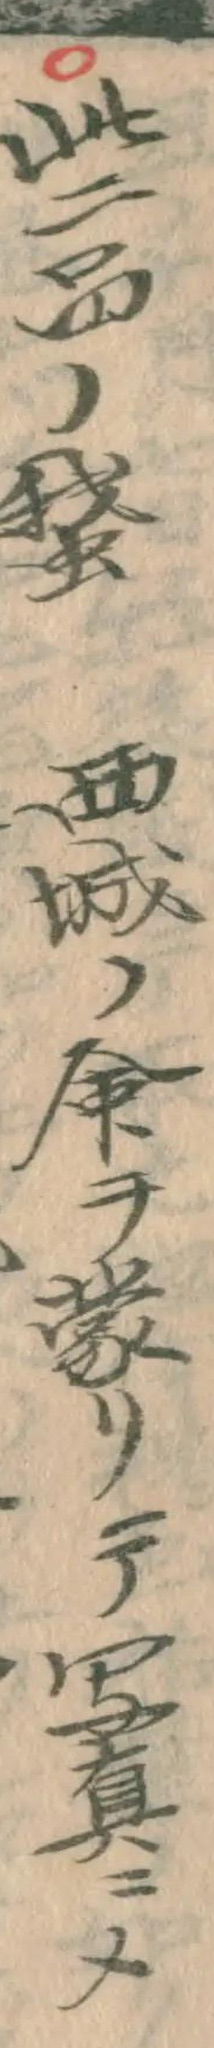◦此二品ノ䖸西城ノ命ヲ蒙リテ写真ニシテ
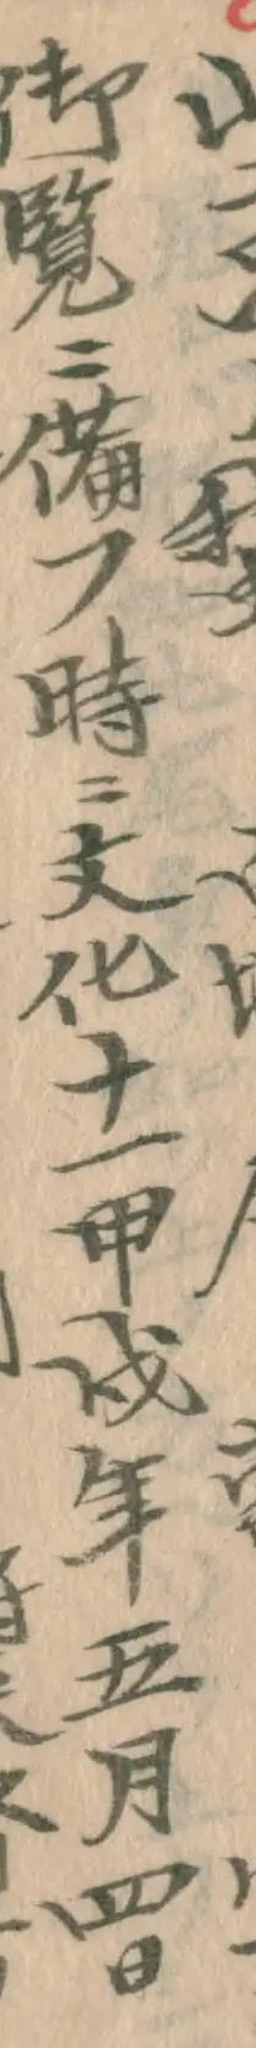御覧ニ備フ時ニ文化十一甲戌年五月四日
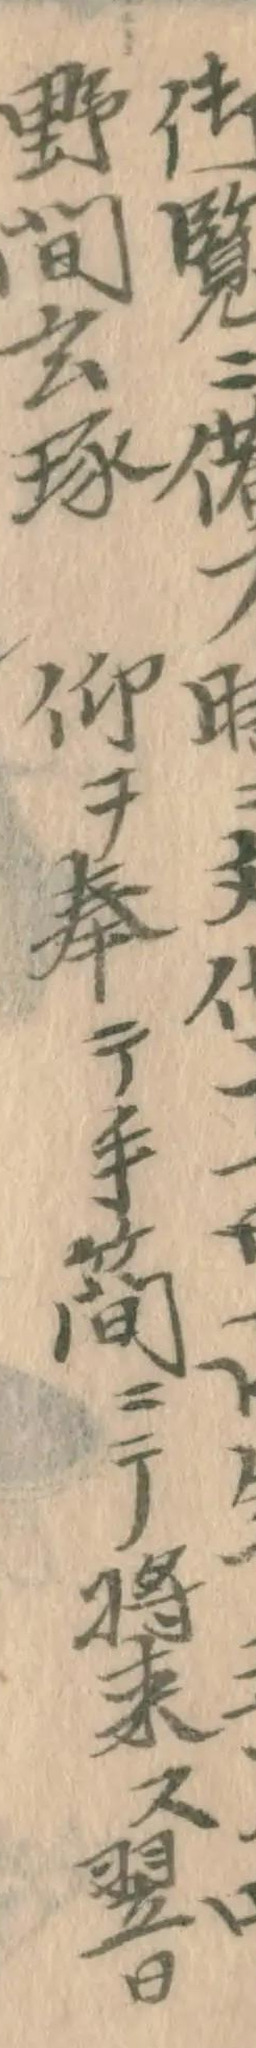野間玄琢仰ヲ奉テ手簡ニテ将来ス翌日
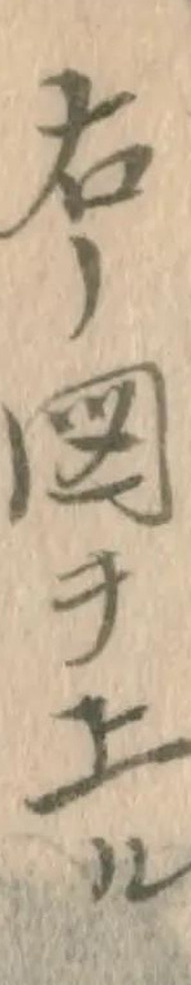右ノ図ヲ上ル
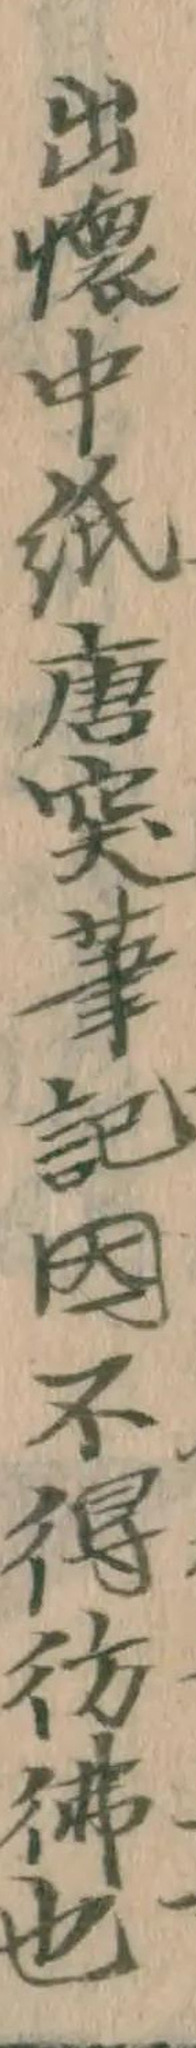出懐中紙唐突筆記因不得彷彿也

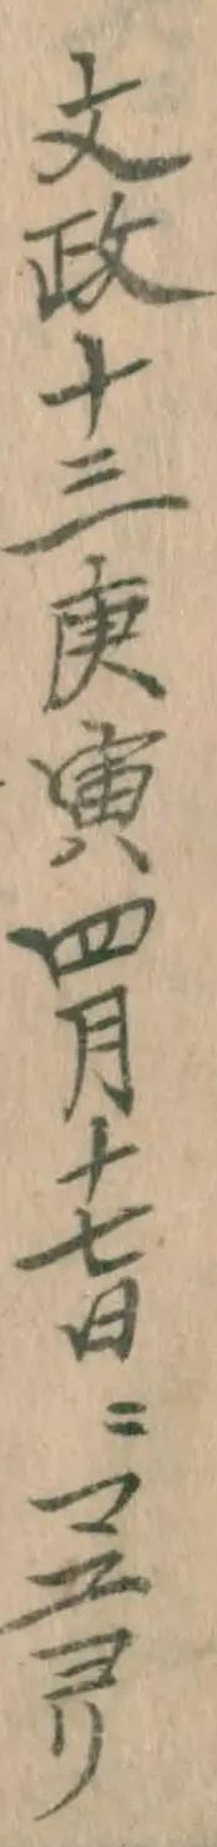蛾文政十三庚寅四月十七日ニマユヨリ
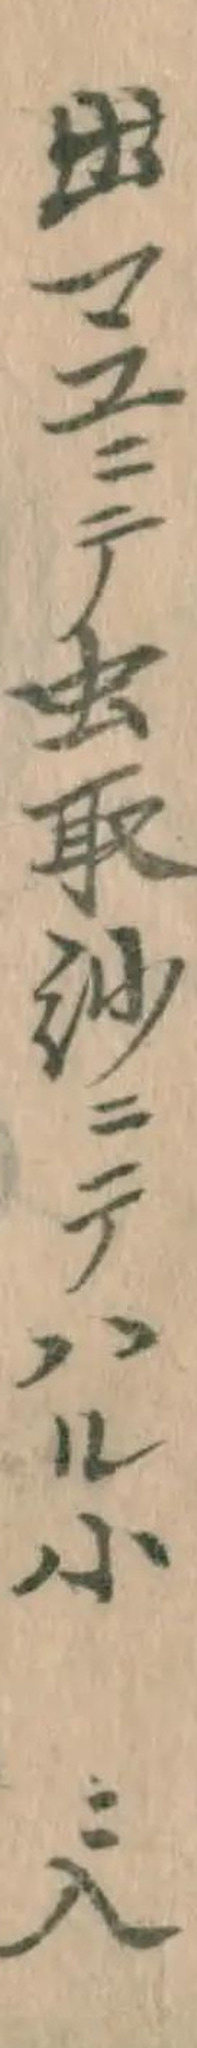出マユニテ虫取紗ニテハル小ニ入
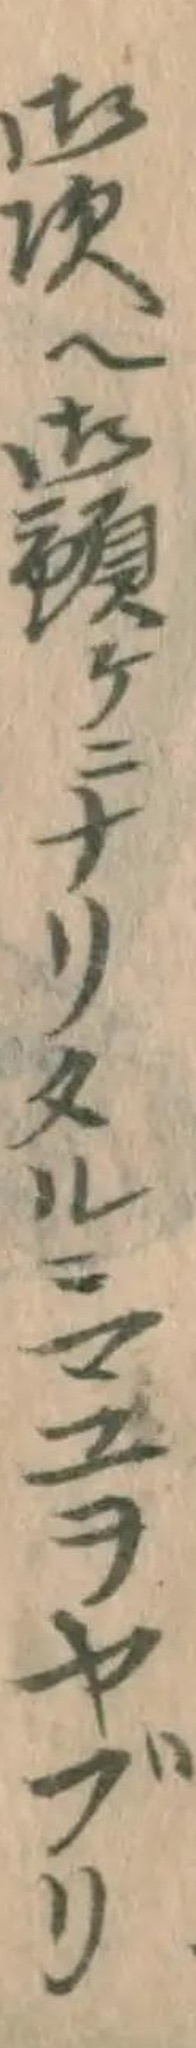御次ヘ御預ケニナリタルニマユヲヤブリ
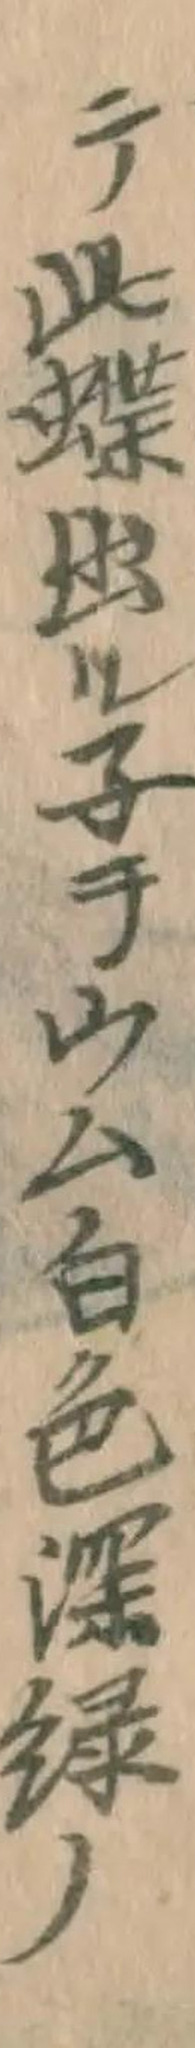テ此蝶出ル子ヲウム白色深緑ノ
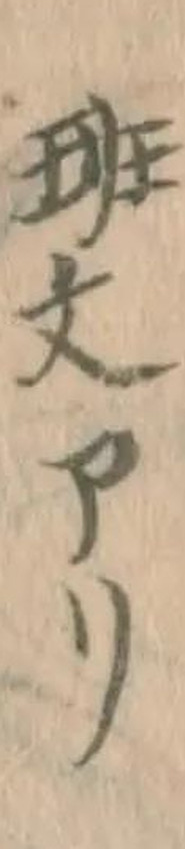班文アリ
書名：千蟲譜 3巻. [1]
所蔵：国立国会図書館 National Diet Library, JAPAN
